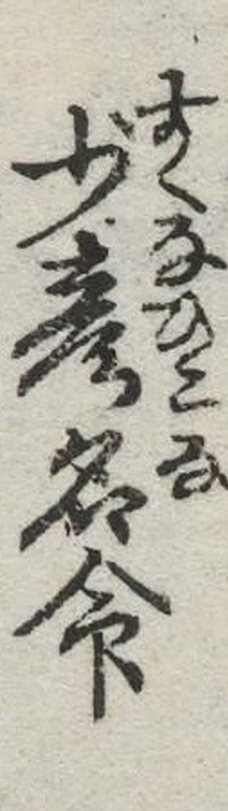少彦名命
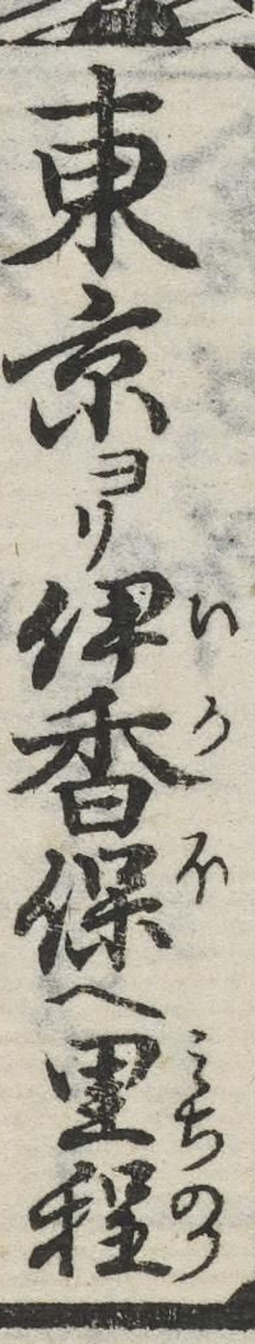東京ヨリ伊香保へ里程
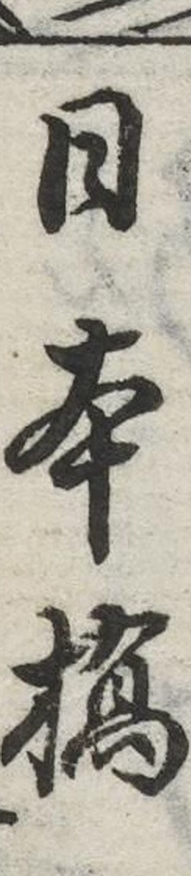日本橋
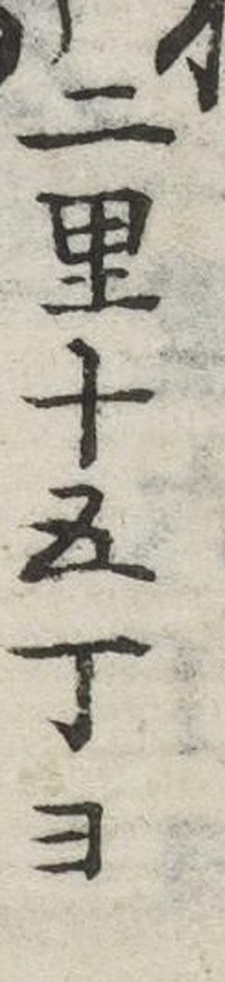二里十五丁ヨ
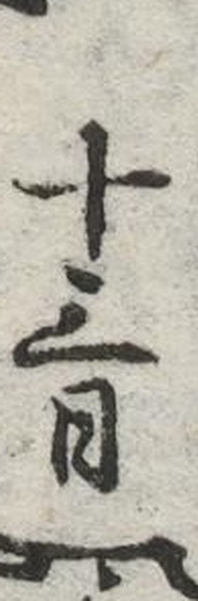十三日
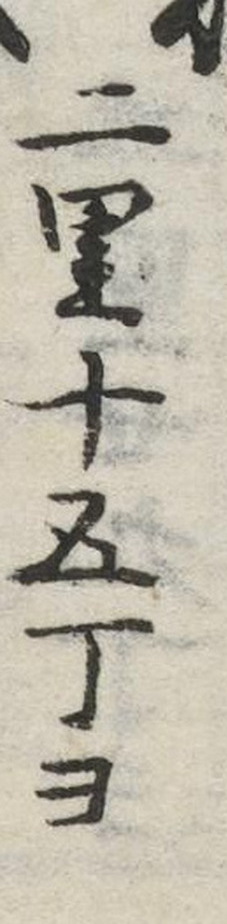二里十五丁ヨ
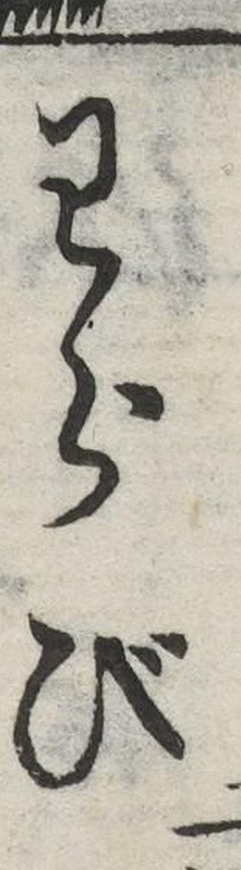わらび
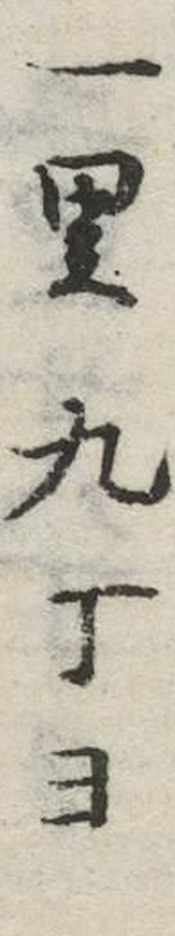一里九丁ヨ
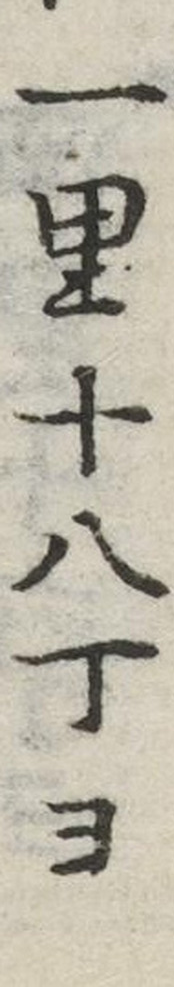一里十八丁ヨ
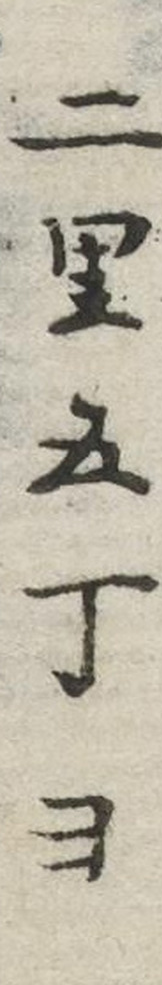二里五丁ヨ
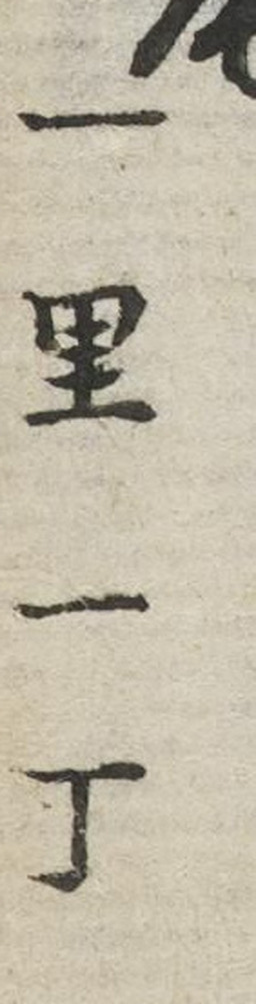一里一丁

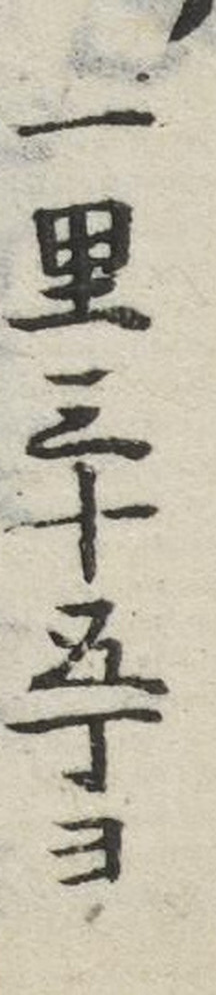一里三十五丁ヨ
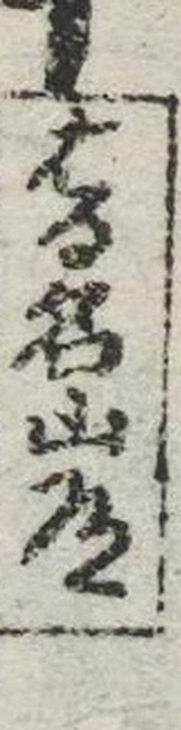はる名山道
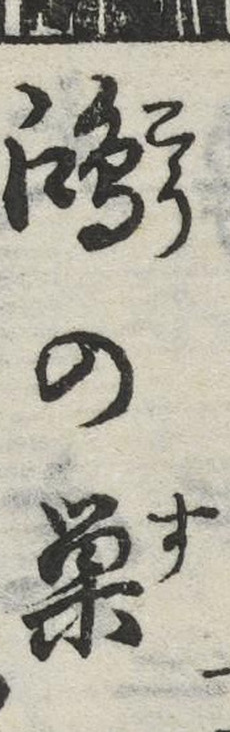鴻の巣
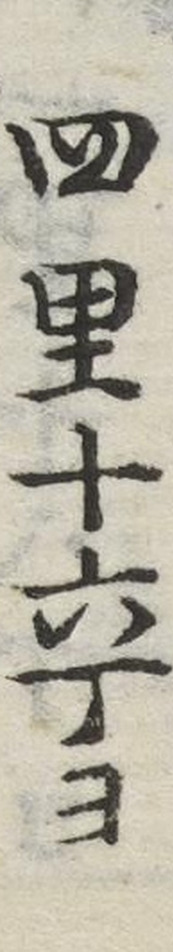四里十六丁ヨ
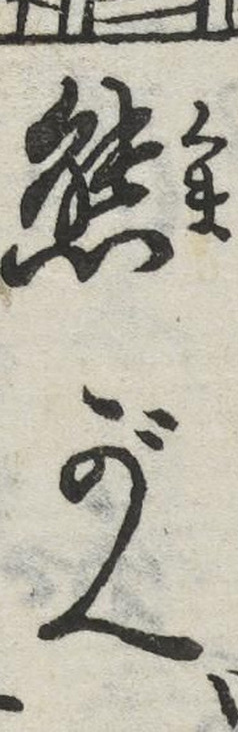熊がへ
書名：諸國温泉遊覽記　全
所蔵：東京大学地震研究所図書室 Earthquake Research Institute Library, The University of Tokyo, JAPAN
